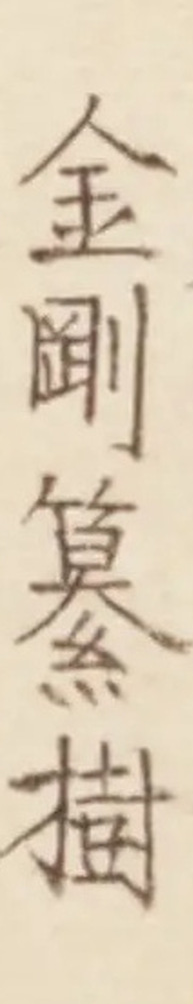金剛纂樹
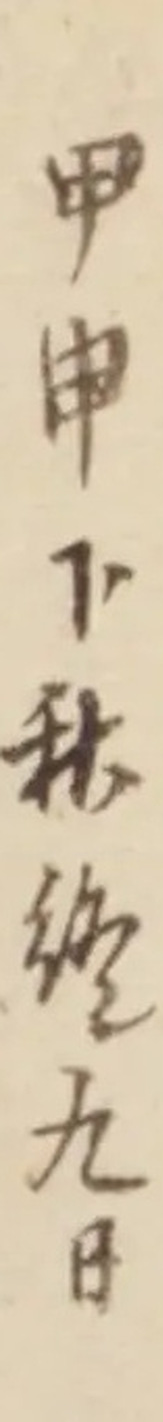甲申下秋終九日
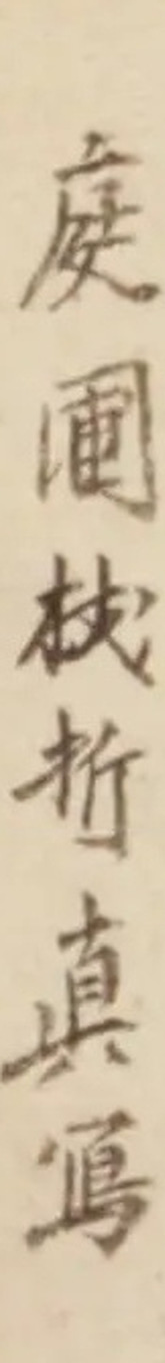庭圃枝折真写

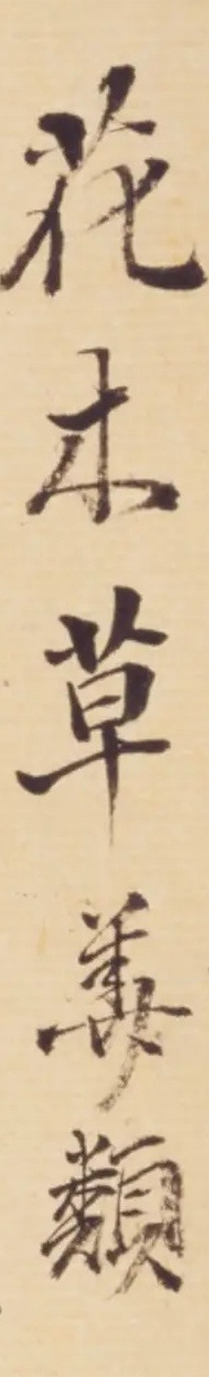花木草華類
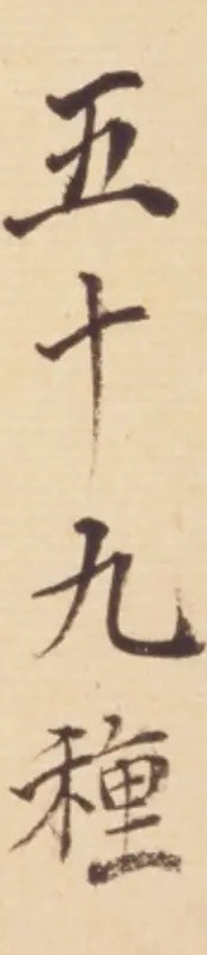五十九種
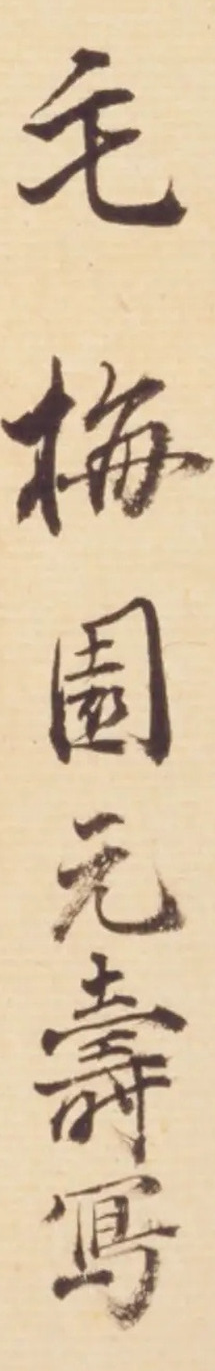毛梅園元寿写
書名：梅園草木花譜秋之部. 2
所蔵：国立国会図書館 National Diet Library, JAPAN
